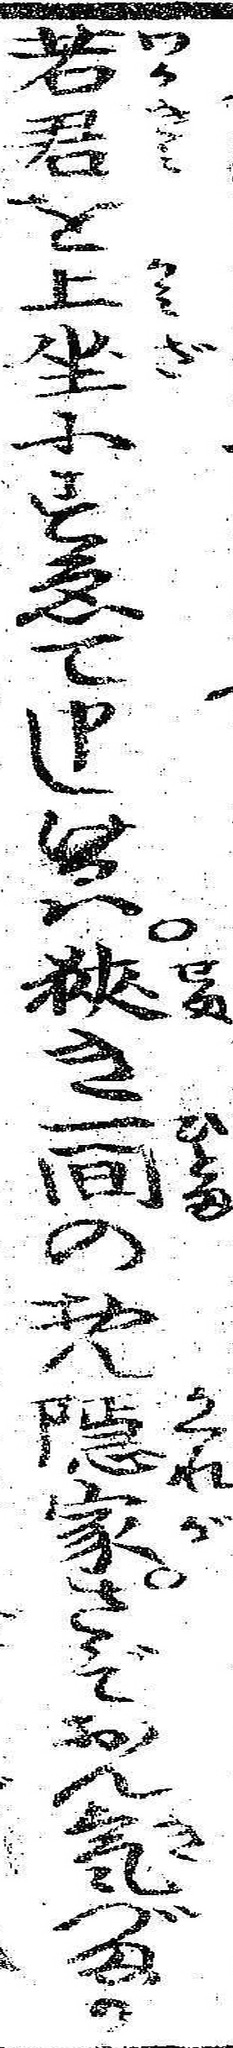若君を上坐にすゑて申しけるは。狭き一間のおん隠家。さぞおん気づまり
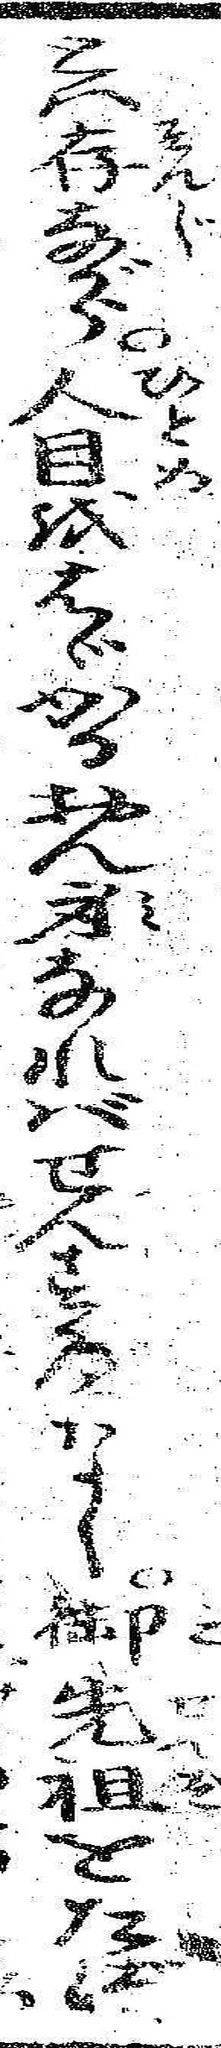とは存ながら。人目をはゞかるおん身なればせんすべなし。御先祖をたづ
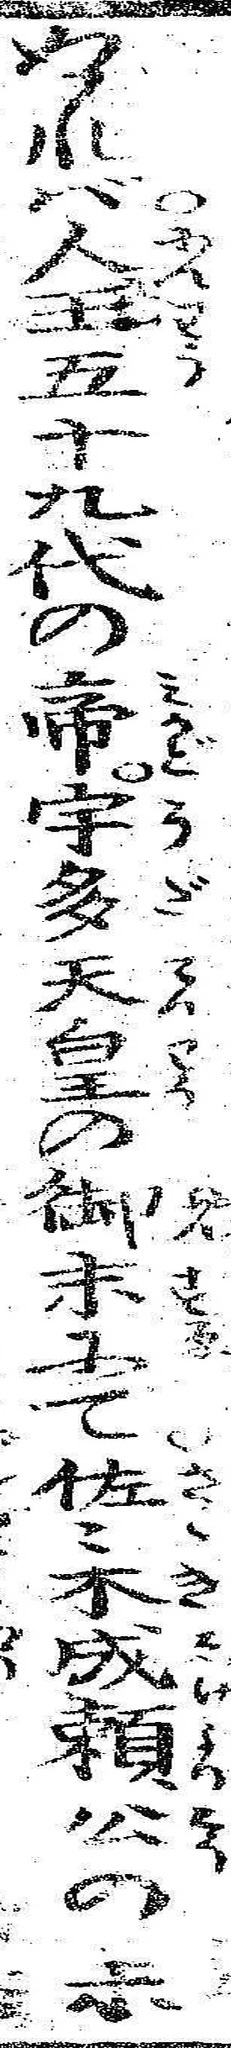ぬれば。人王五十九代の帝。宇多天皇の御末にて。佐々木成頼公の末
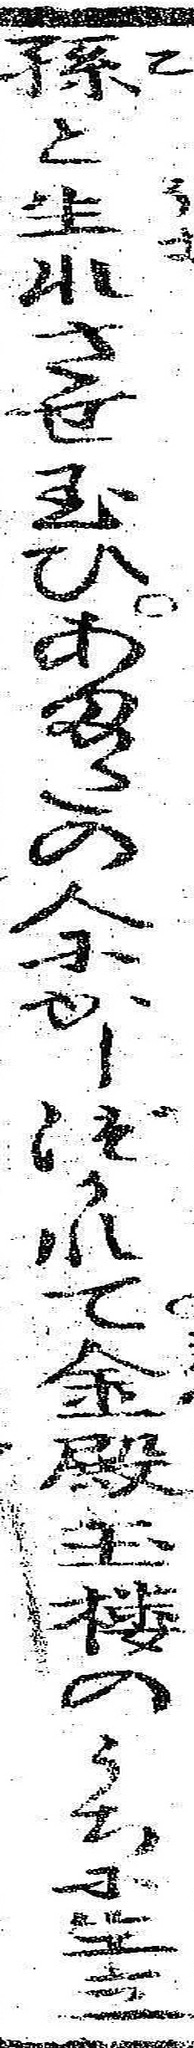孫と生れさせ玉ひ。あまたの人にかしづかれて。金殿玉楼のうちに生立
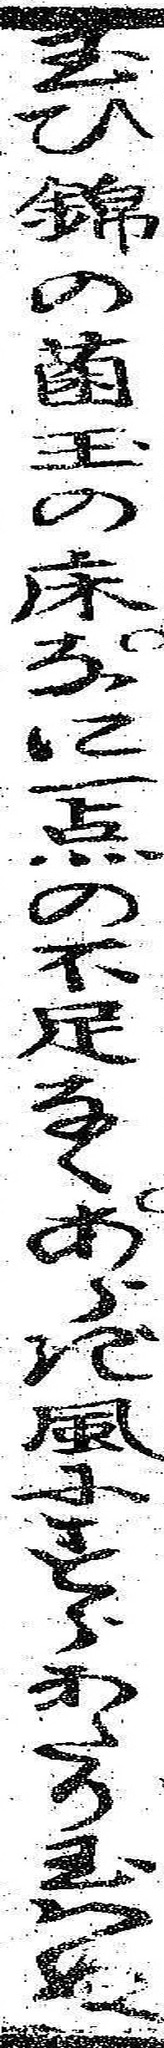玉ひ。錦の菌玉の床。なに一点の不足なく。あらき風にすらあたり玉はぬ
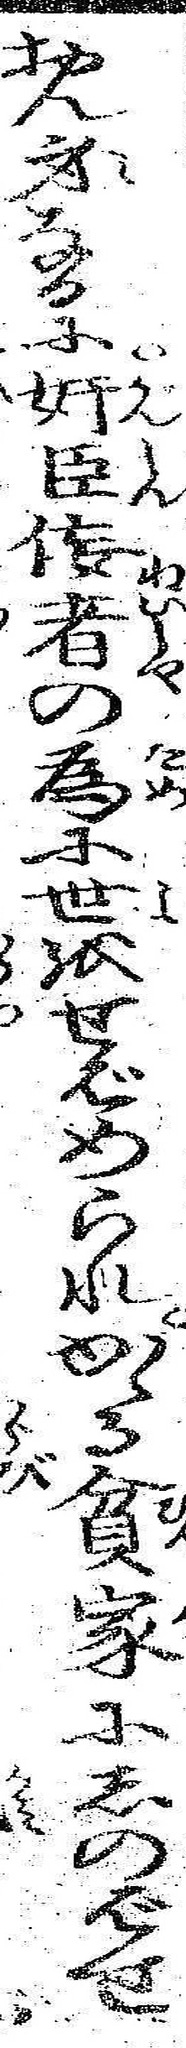おん身なるに。奸臣佞者の為に世をせばめられ。かゝる貧家にしのばせ
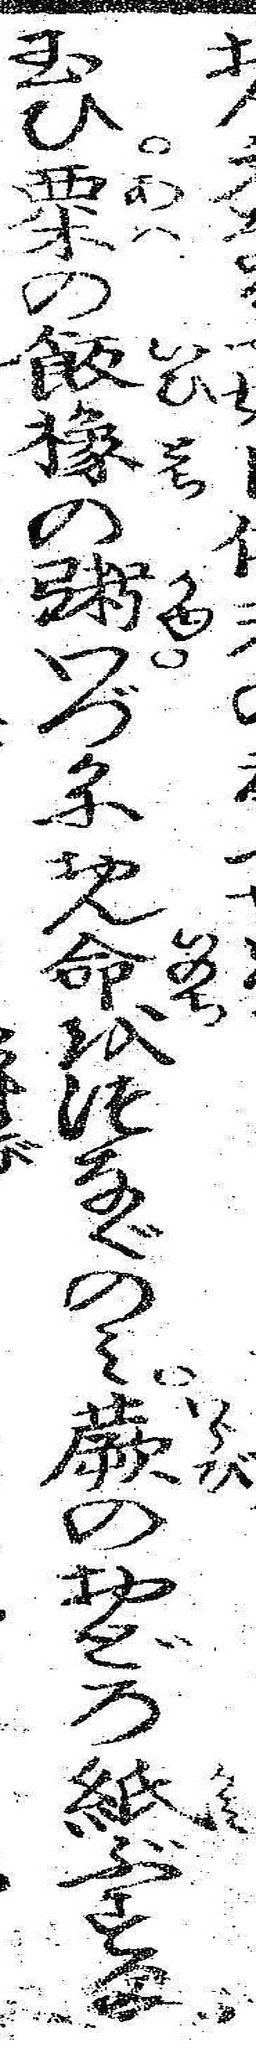玉ひ。粟の飯橡の粥。わづかにおん命をつなぐのみ。蕨のおどろ紙ぶすま。
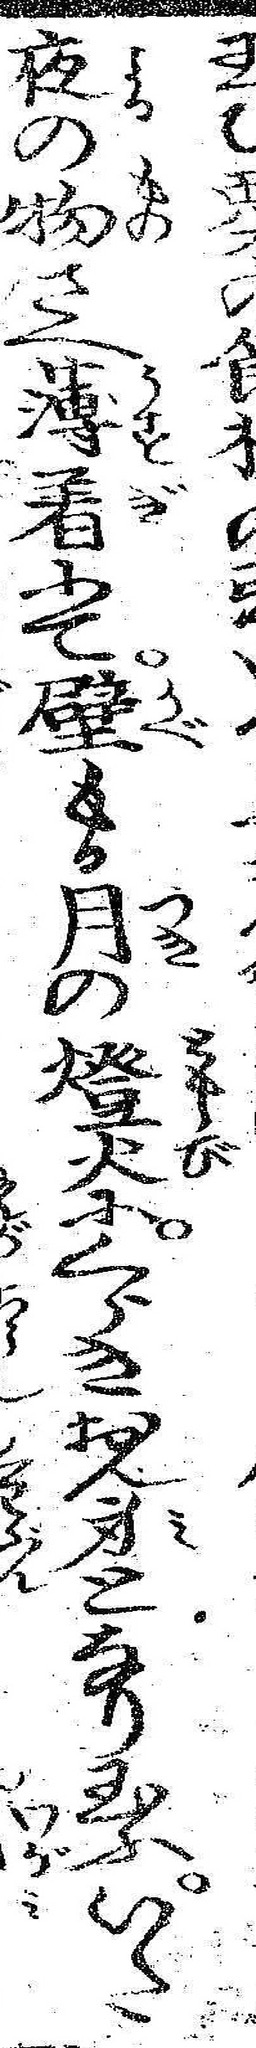夜の物さへ薄着にて。壁もる月の灯火に。くらきおん身となり玉ふ。いた
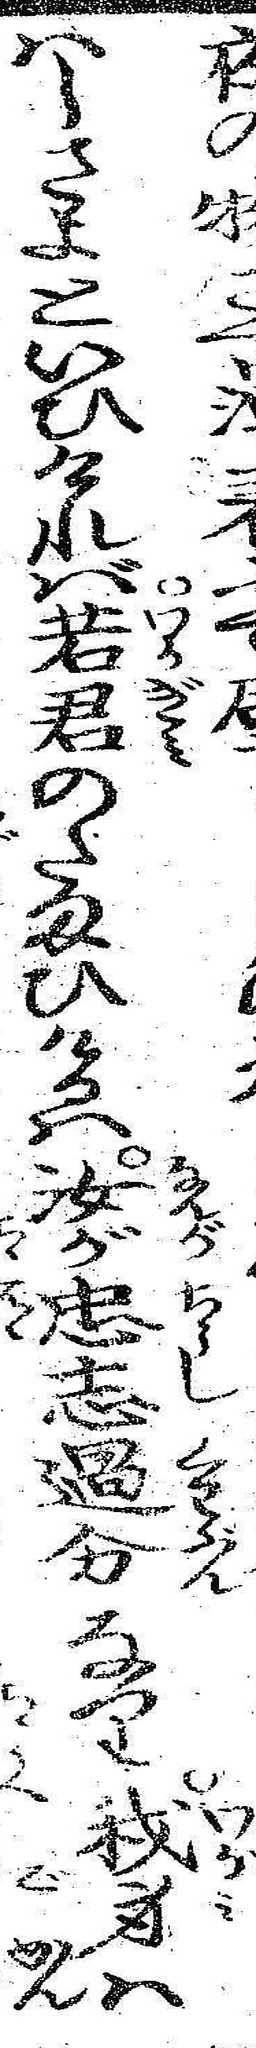はしさよといひければ。若君のたまひけるは。汝が忠志過分なり。我身は
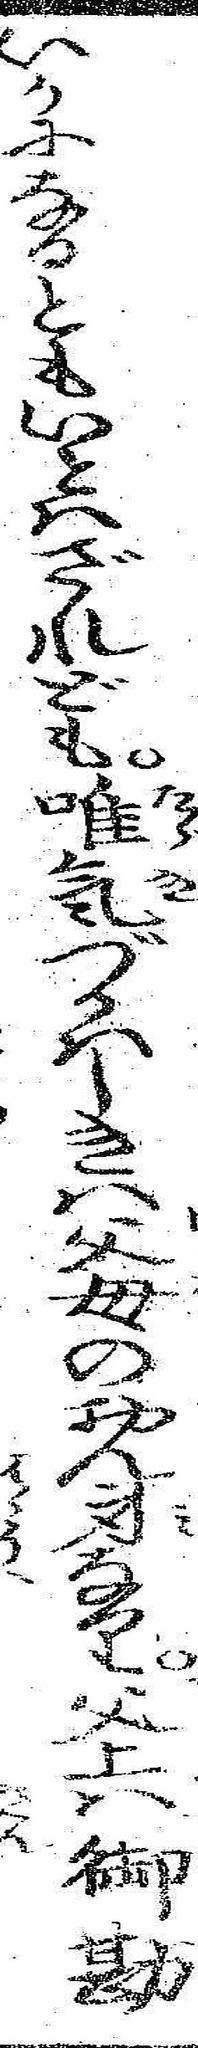いかになるともいとはざれども。唯気づかはしきは父母のおん身なり。父上は御勘
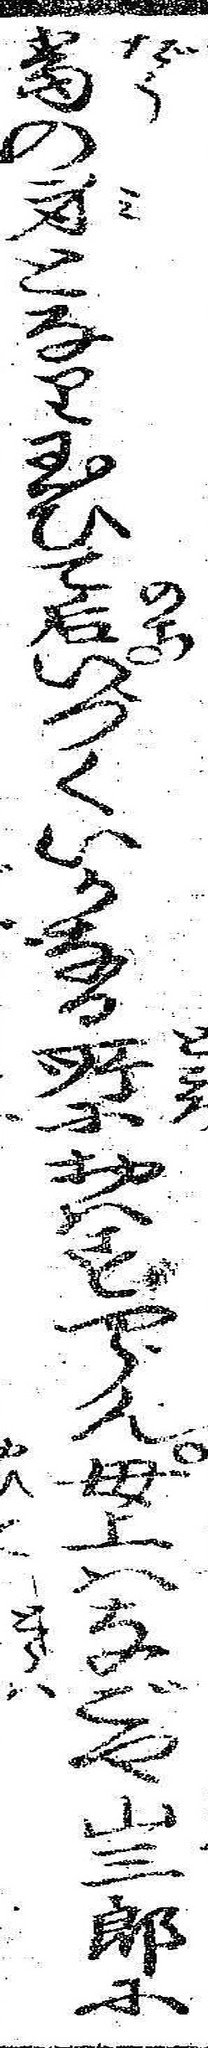当の身となり玉ひて后。いづくいかなる所におはすやらん。母上はなごや山三郎に
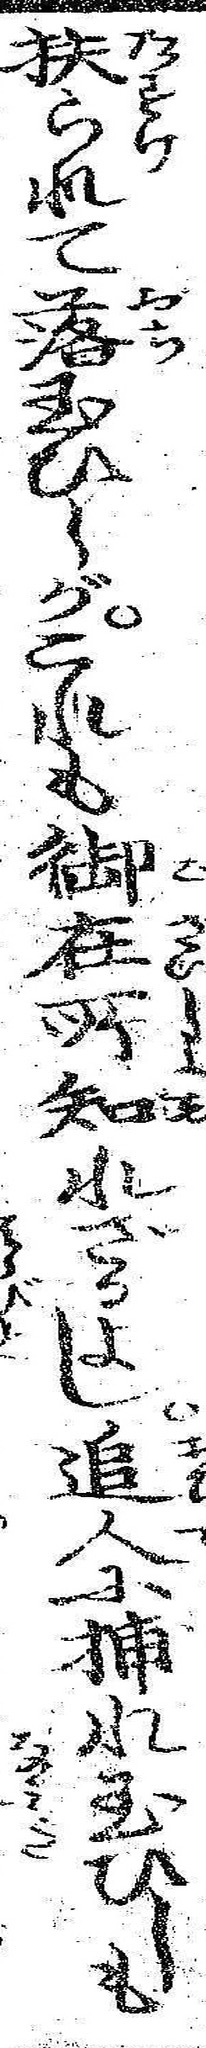扶られて落玉ひしが。これも御在所知れざるよし。追人に捕れ玉ひしも
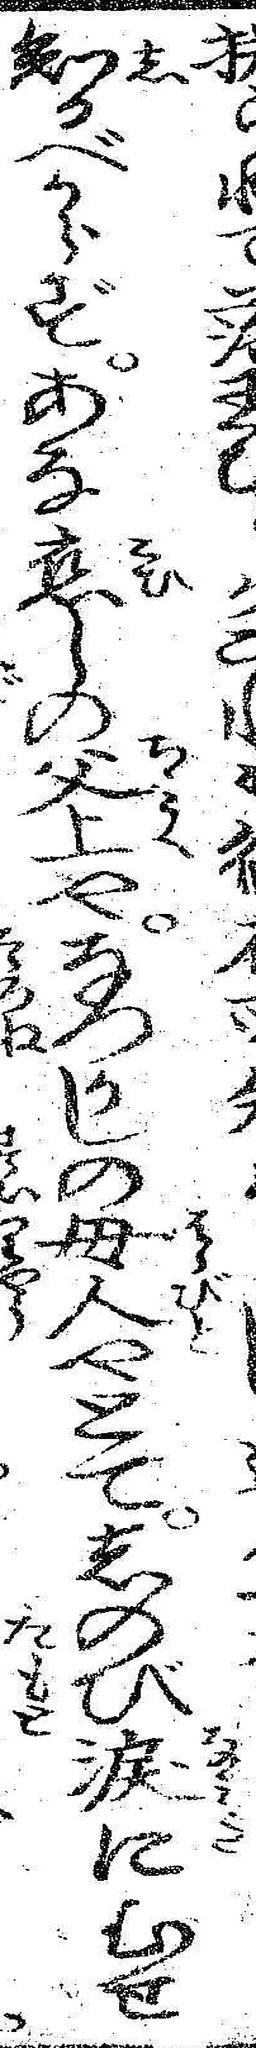知るべからず。あな恋しの父上や。なつかしの母人やとて。しのび涙にむせ
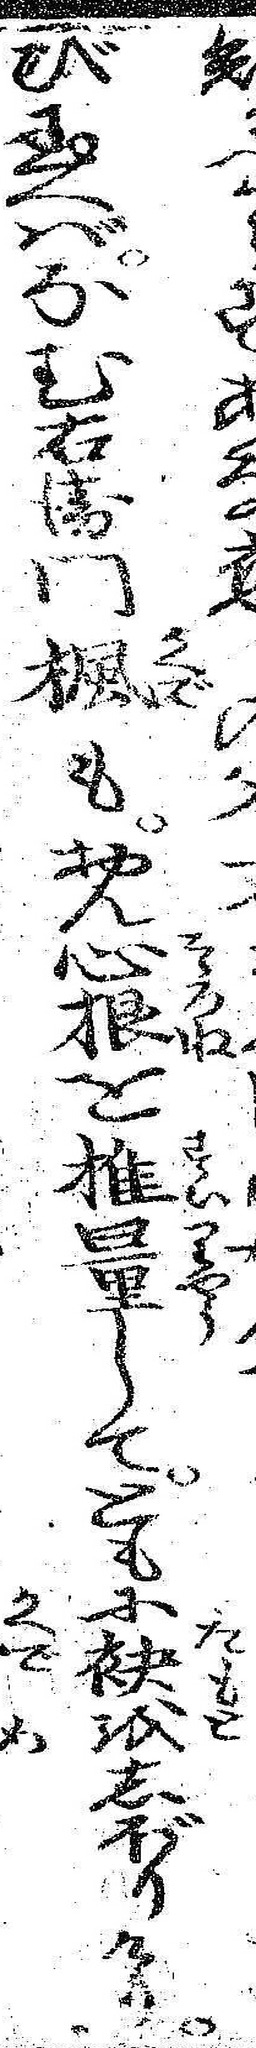び玉へば。なむ右衛門楓も。おん心根を椎量して。ともに袂をしぼりけり。
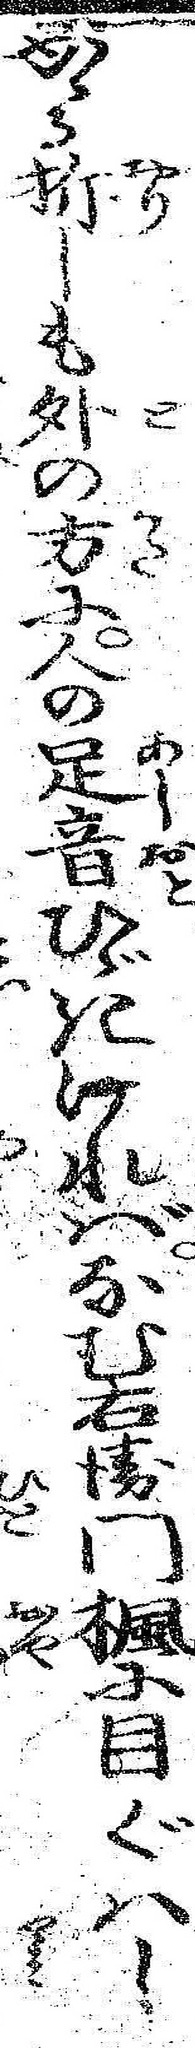かゝる折しも外の方に人の足音ひゞきければ。なむ右衛門楓に目ぐはし
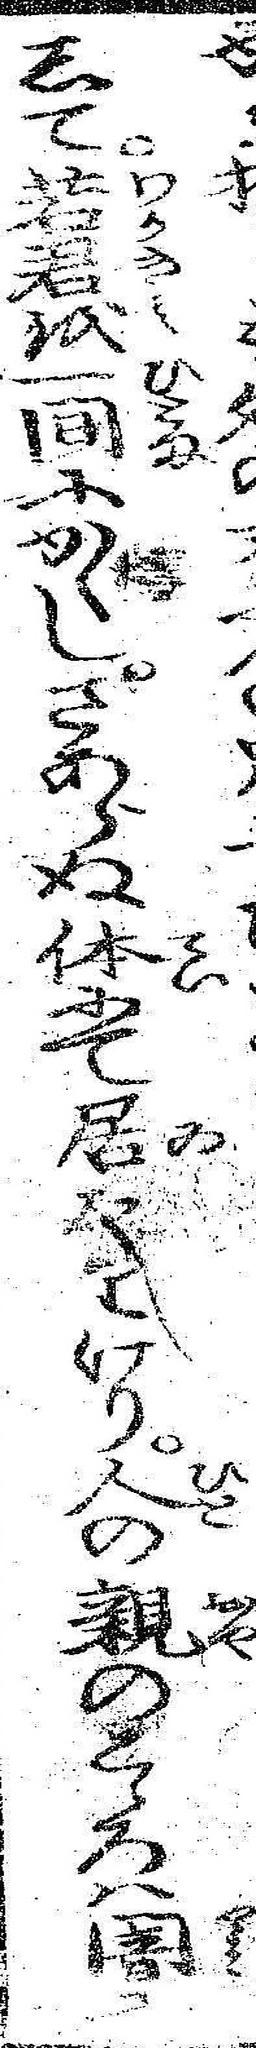して。若君を一間にかくし。さあらぬ体にて居たりけり。人の親のこゝろは闇に
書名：昔話稲妻表紙
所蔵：国文学研究資料館
